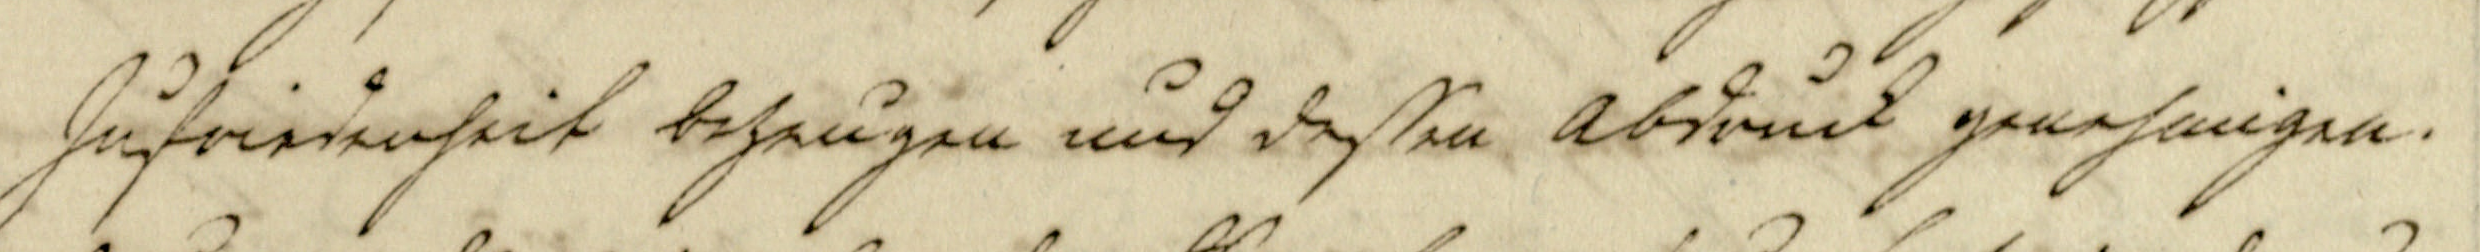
Zufriedenheit bezeugen und dessen Abdruck genehmigen.
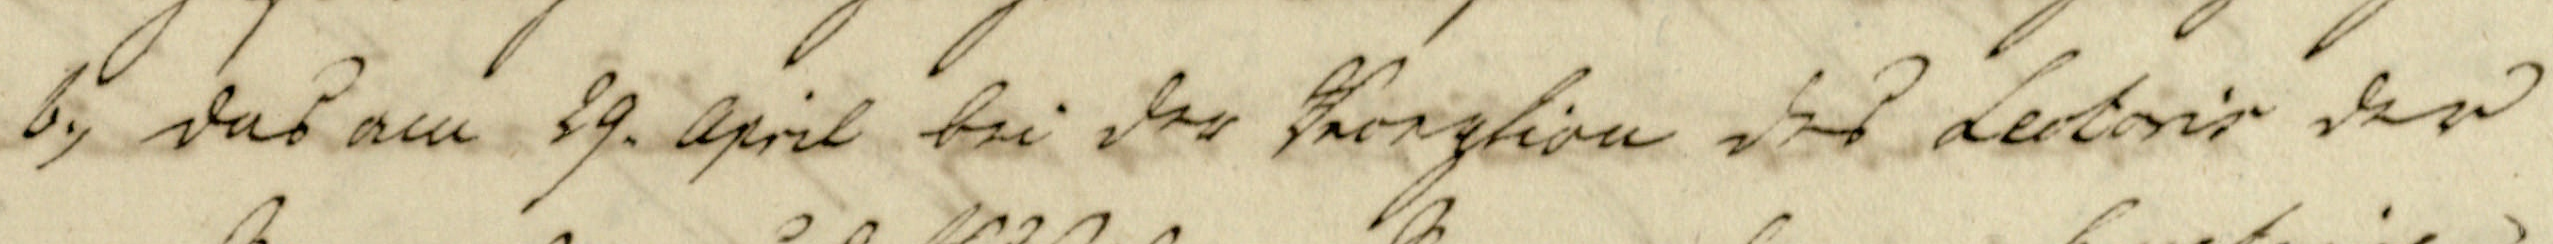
b., das am 29. April bei der Reception des Lestoris der
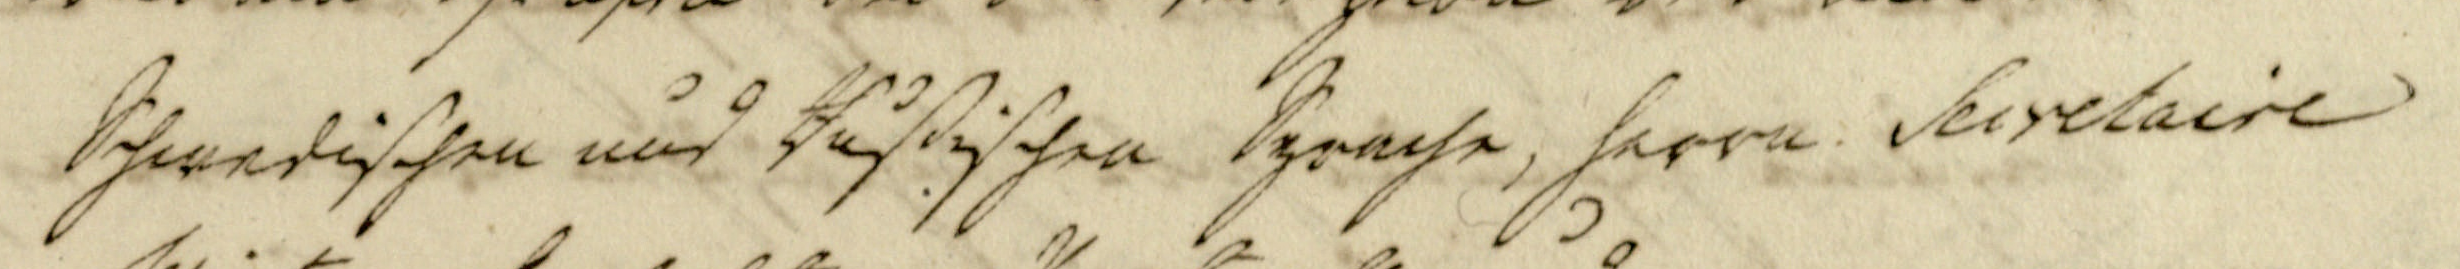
Schwedischen und Rußischen Sprache, Herrn Secretaire
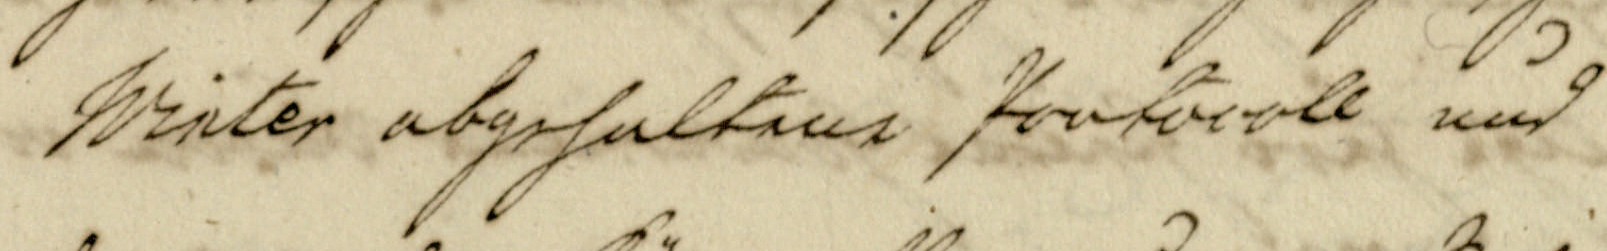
Winter abgehaltene Protocoll und
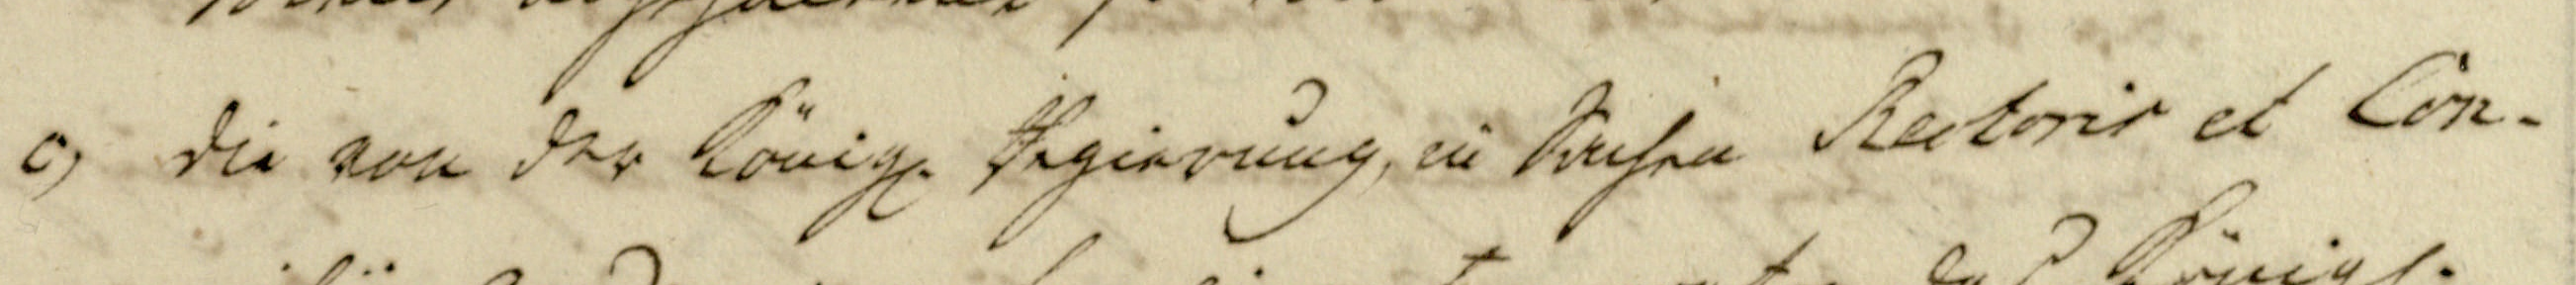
c., die von der Königl. Regierung, in Sachen Rectoris et Con¬
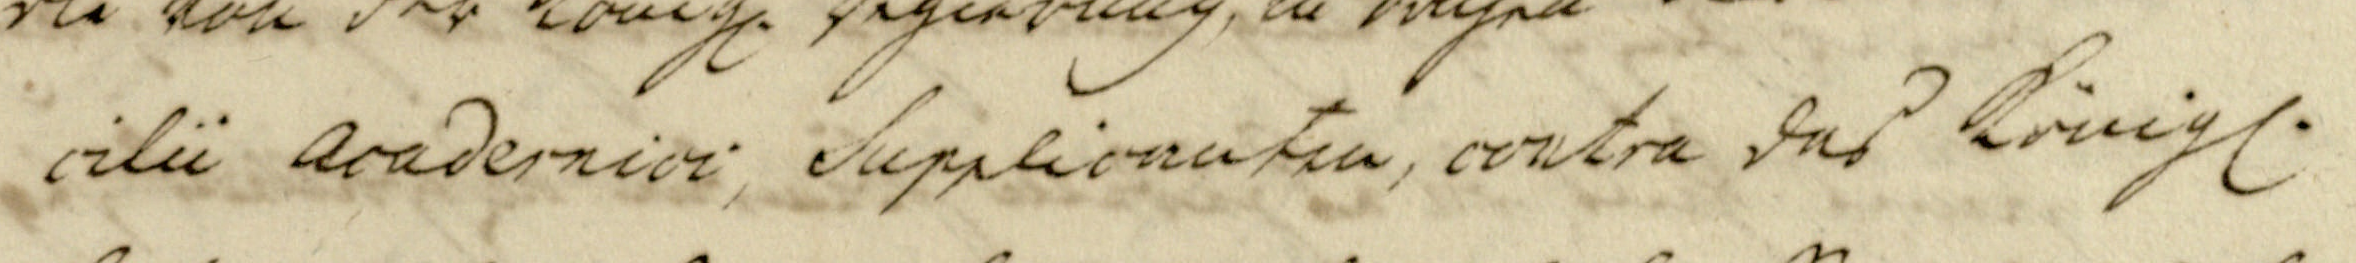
cilii Academici Supplicanten, contra das Königl.
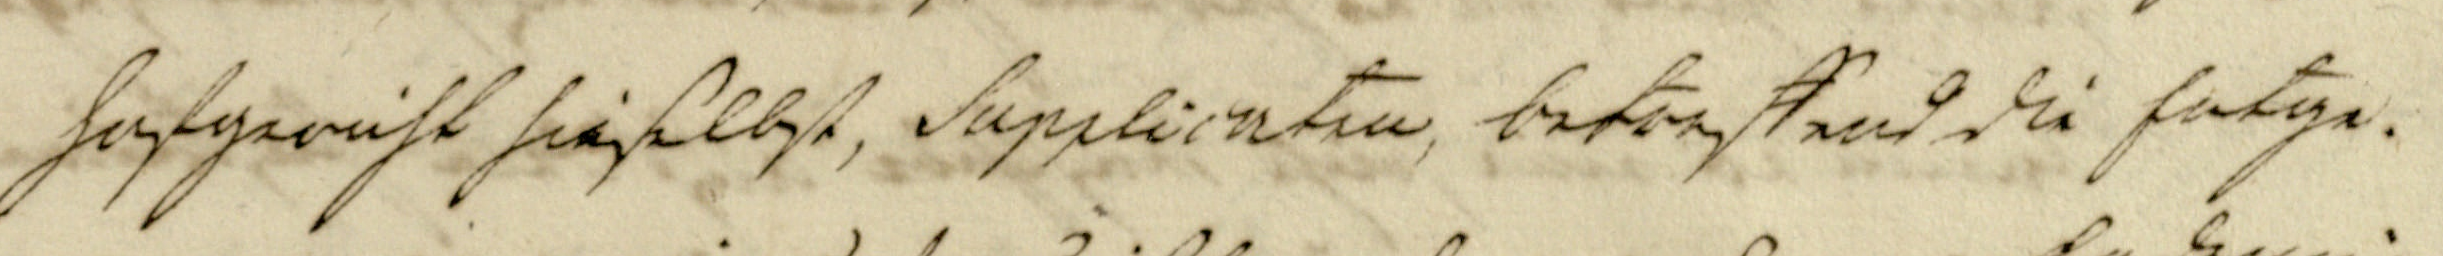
Hofgericht hieselbst, Supplicaten, betreffend die Entge¬
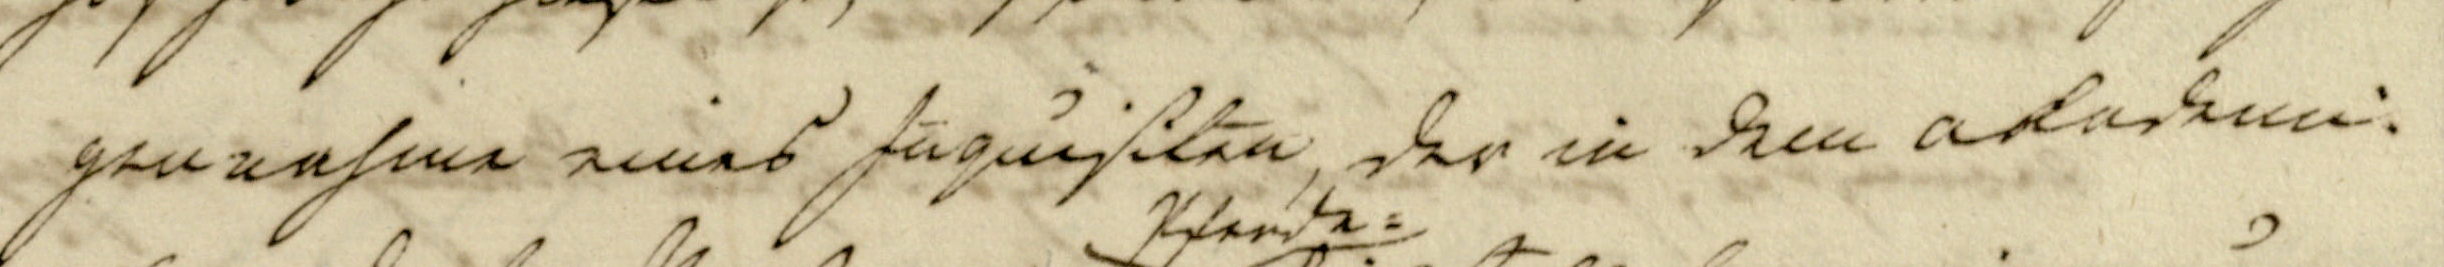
gennahme eines Inquisiten, der in dem akademi¬
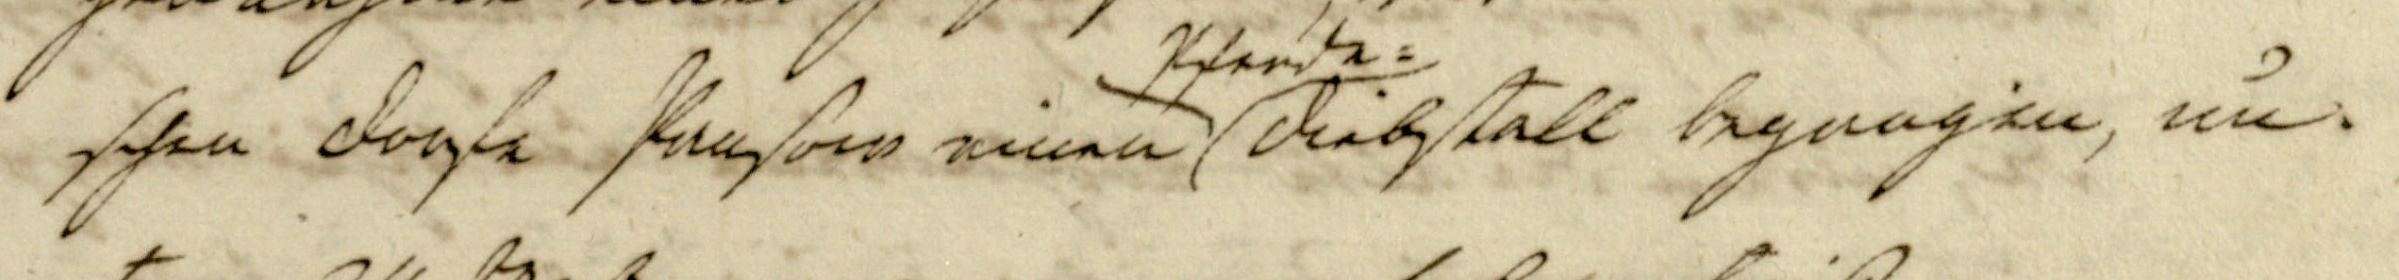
schen Dorfe Pansow einen Pferde-Diebstahl begangen, un¬
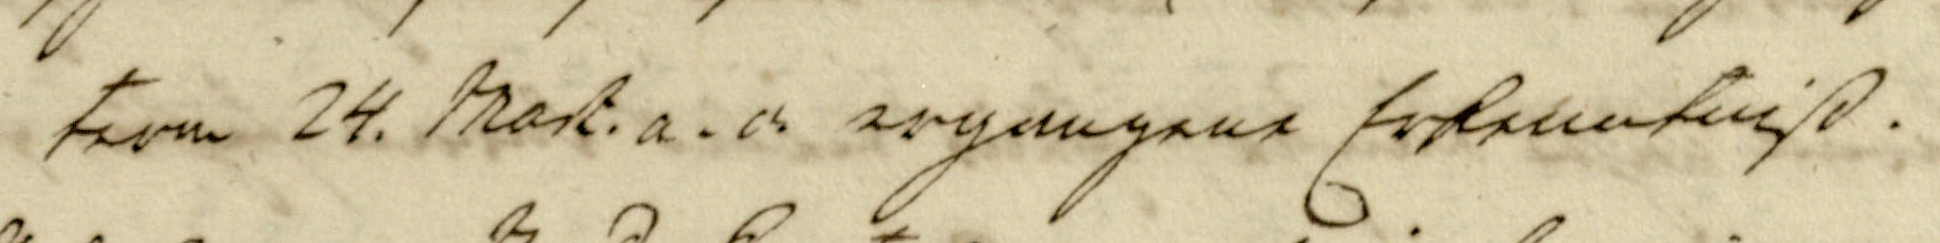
term 24. Mart. a. c. ergangene Erkenntniß.
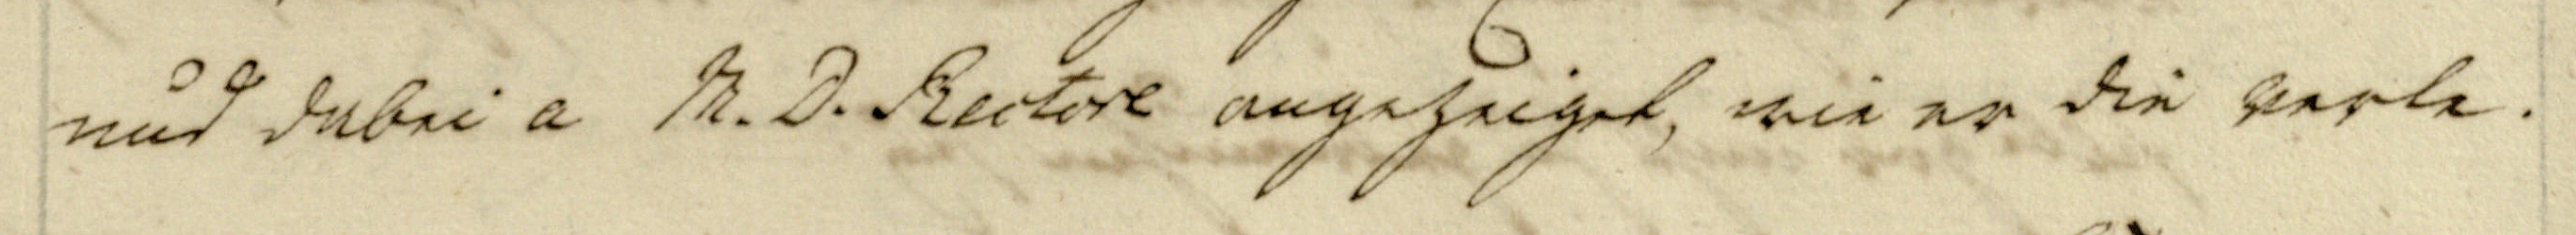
und dabei a M. D. Rectore angezeiget, wie er die verle¬
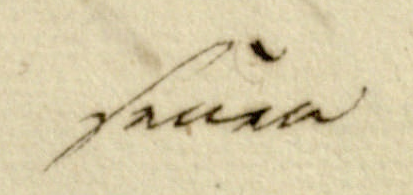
senen
